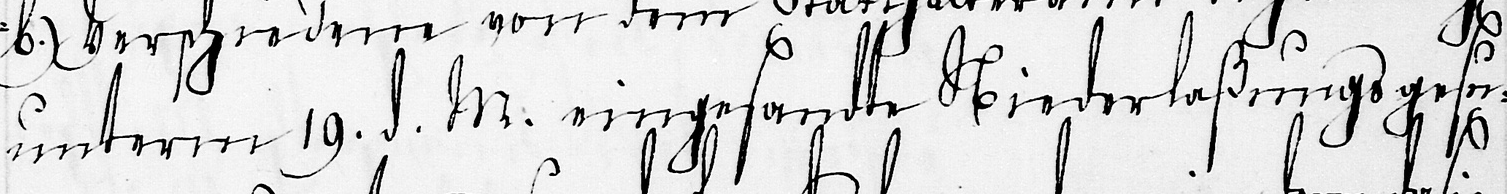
unterm 19. d. M. eingesandte Niederlaßungsgesu¬
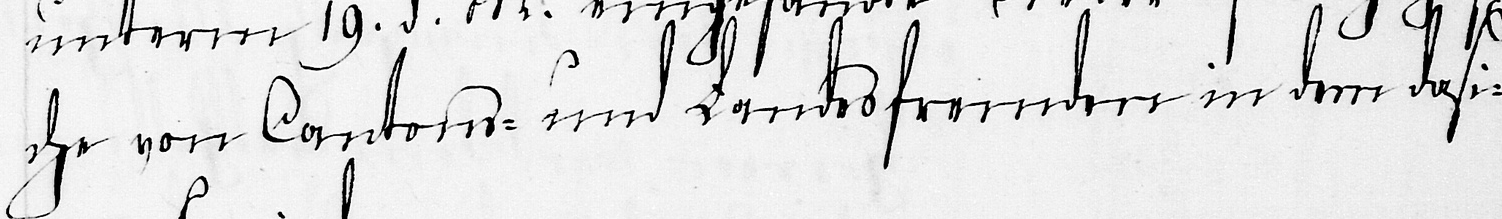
che von Cantons- und Landesfremden in dem dasi¬
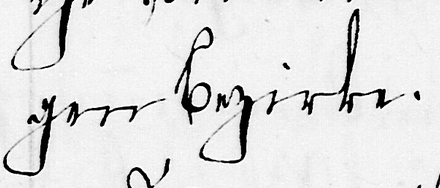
gen Bezirke.
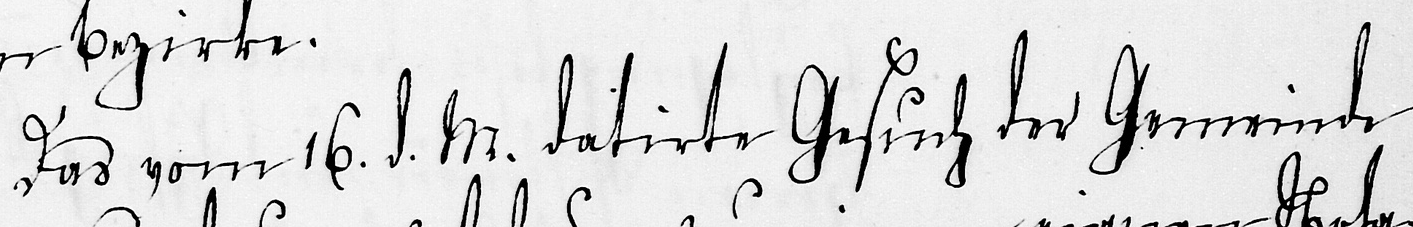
Das vom 16. d. M. datirte Gesuch der Gemeinde
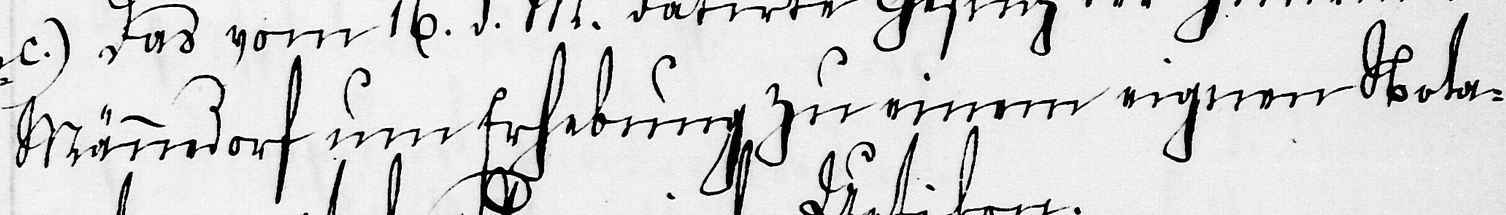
Männedorf um Erhebung zu einem eignen Nota¬
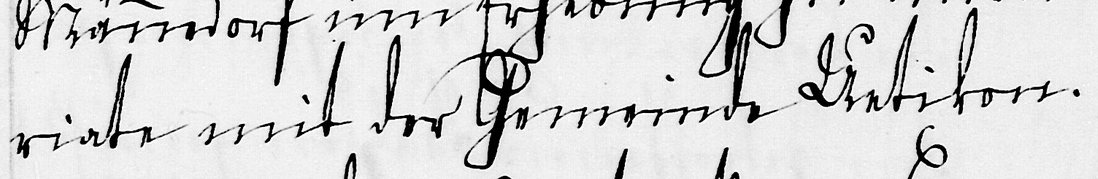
riate mit der Gemeinde Uetikon.
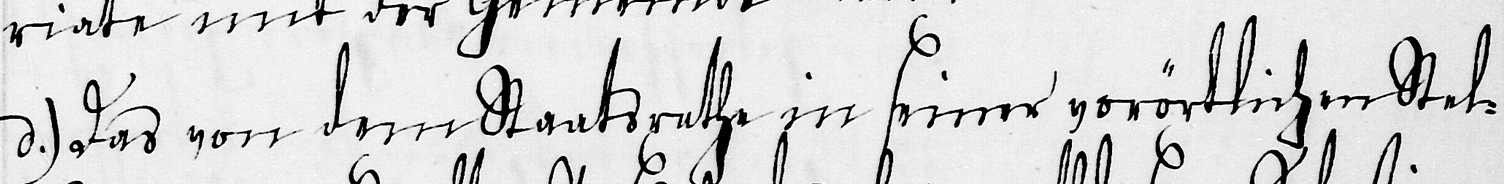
d.) Das von dem Staatsrathe in seiner vorörtlichen Stel¬
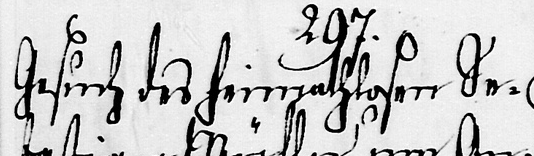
such des heimathlosen Seb¬
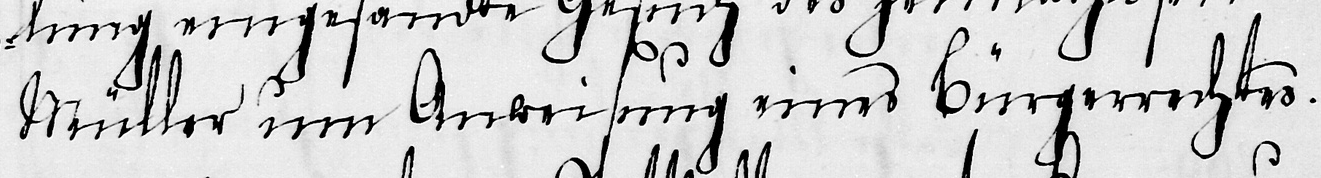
Müller um Anweisung eines Bürgerrechtes.
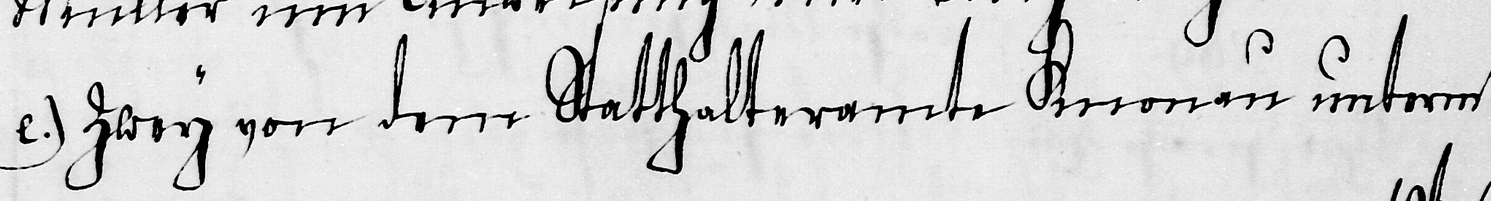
e.) Zwey von dem Statthalteramte Knonau unterm
